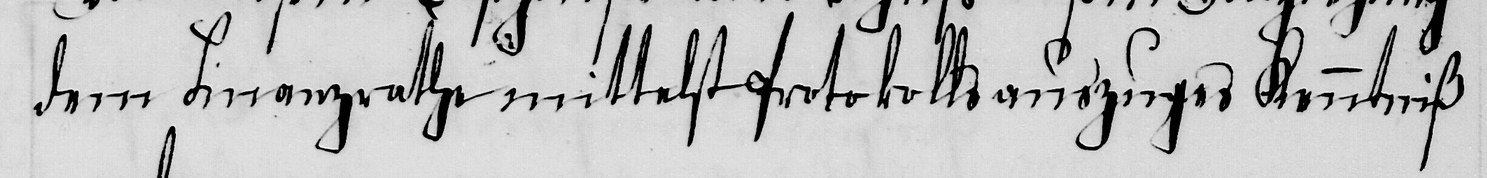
dem Finanzrathe mittelst Protokollsauszuges Kenntniß
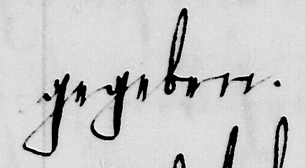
gegeben.
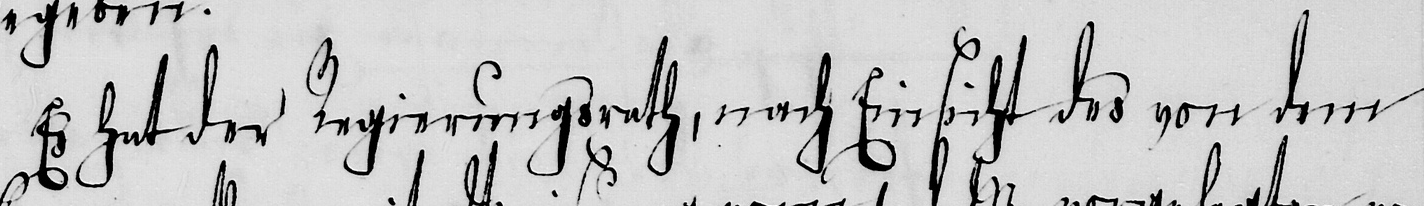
Es hat der Regierungsrath, nach Einsicht des von dem
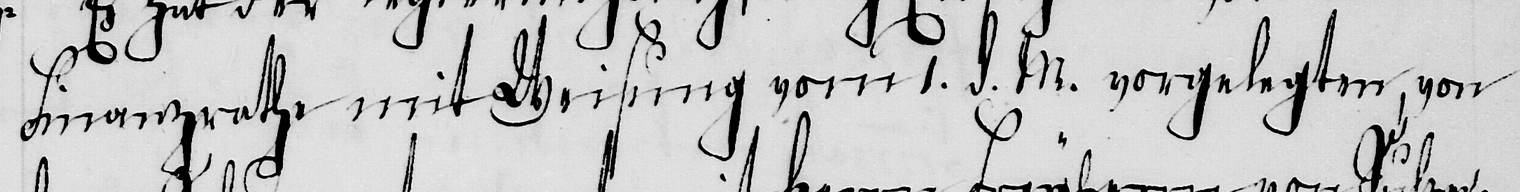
Finanzrathe mit Weisung vom 1. d. M. vorgelegtem, von
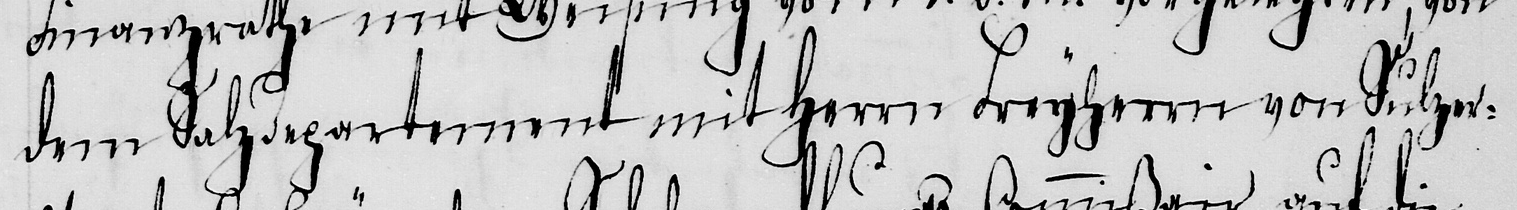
dem Salzdepartement mit Herrn Freyherrn von Sulze¬
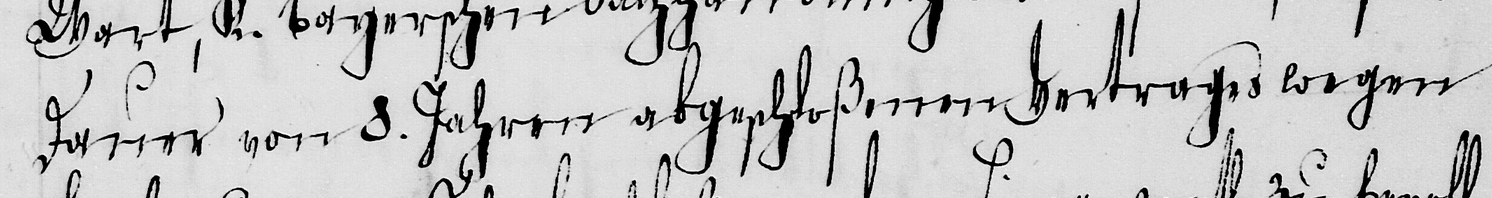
Dauer von 8. Jahren abgeschloßenen Vertrages wegen
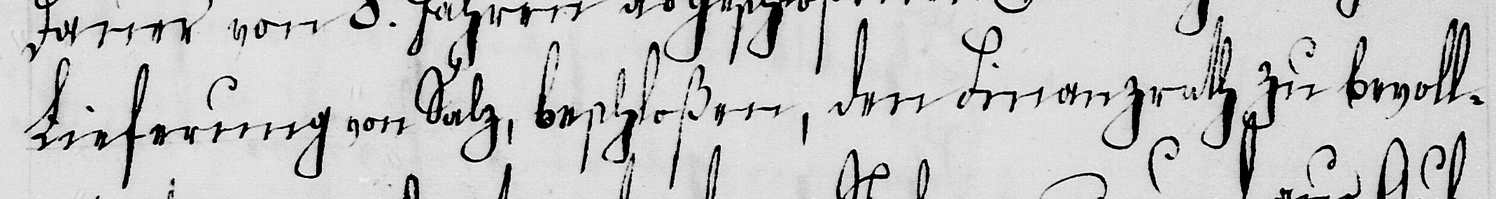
Lieferung von Salz, beschloßen, den Finanzrath zu bevoll¬
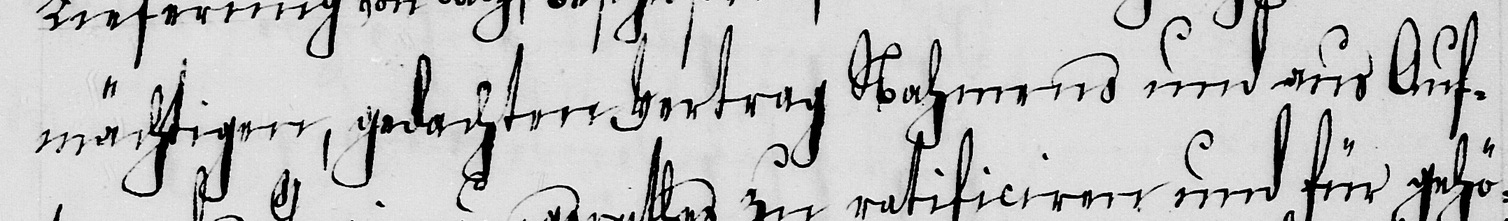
mächtigen, gedachten Vertrag Nahmens und aus Auf¬
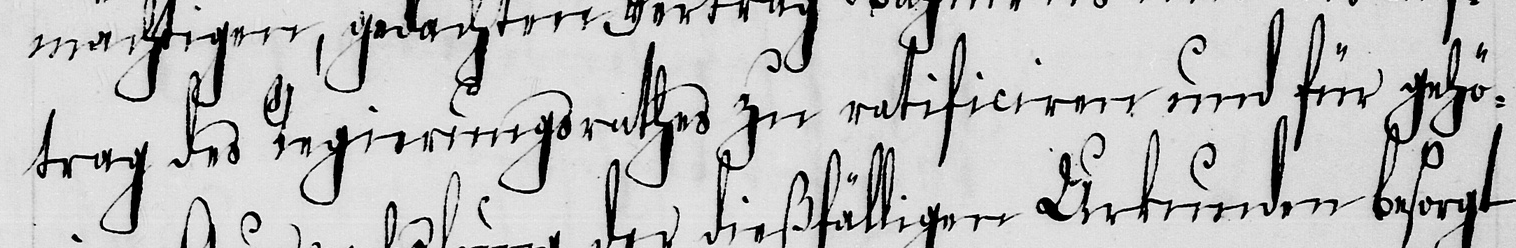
trag des Regierungsrathes zu ratificiren und für gehö¬
